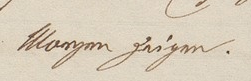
Morgen zeigen.
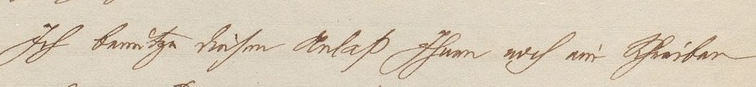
Ich benutze diesen Anlaß Ihnen noch ein Schreiben
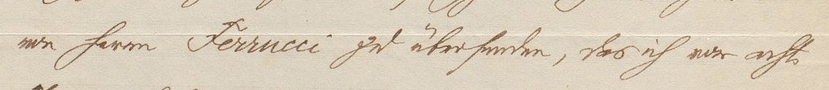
von Herrn Ferrucci zu übersenden, das ich vor acht
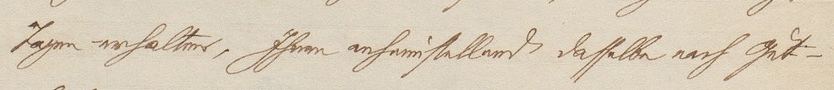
Tagen erhalten, Ihnen anheimstellend dasselbe nach Gut-
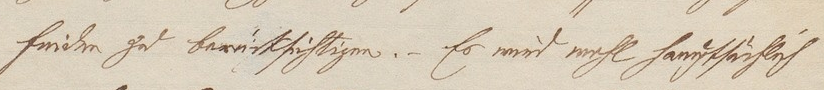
finden zu berücksichtigen. – Es wird wohl hauptsächlich
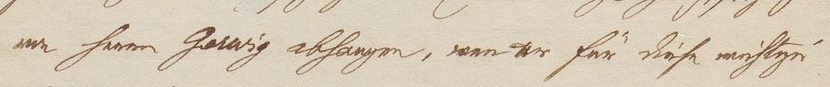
von Herrn Gerwig abhangen, wen er für diese wichtige
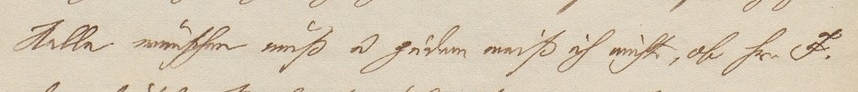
Stelle wünschen muß u zudem weiß ich nicht, ob Hr. F.
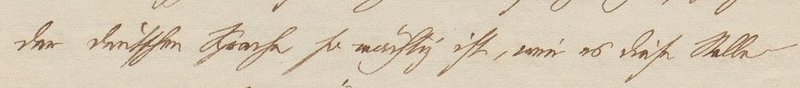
der deutschen Sprache so mächtig ist, wie es diese Stelle
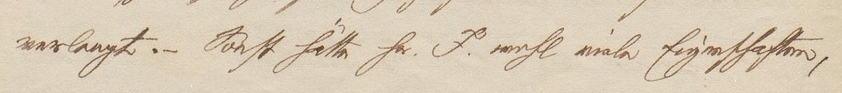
verlangt. – Sonst hätte Hr. F. wohl viele Eigenschaften,
